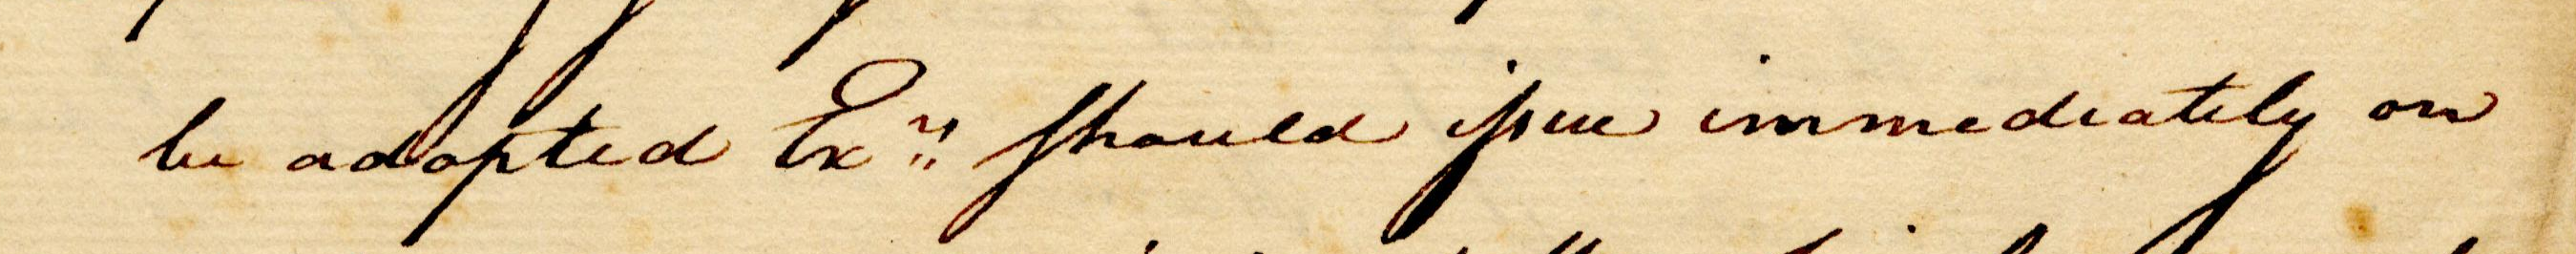be adopted Ex^s should issue immediately on
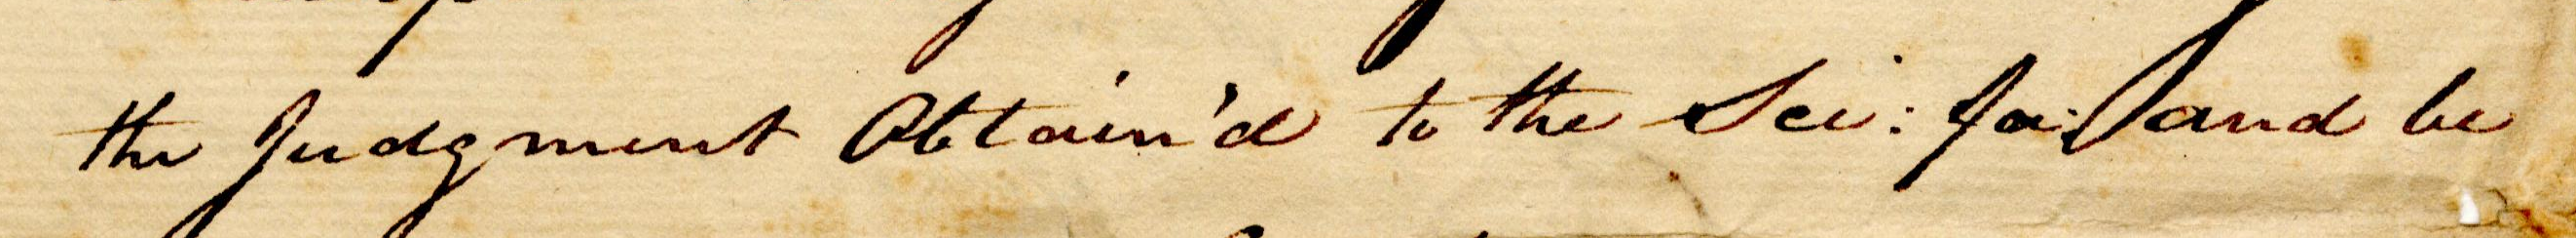the Judgment obtain'd to the Sec: far and be
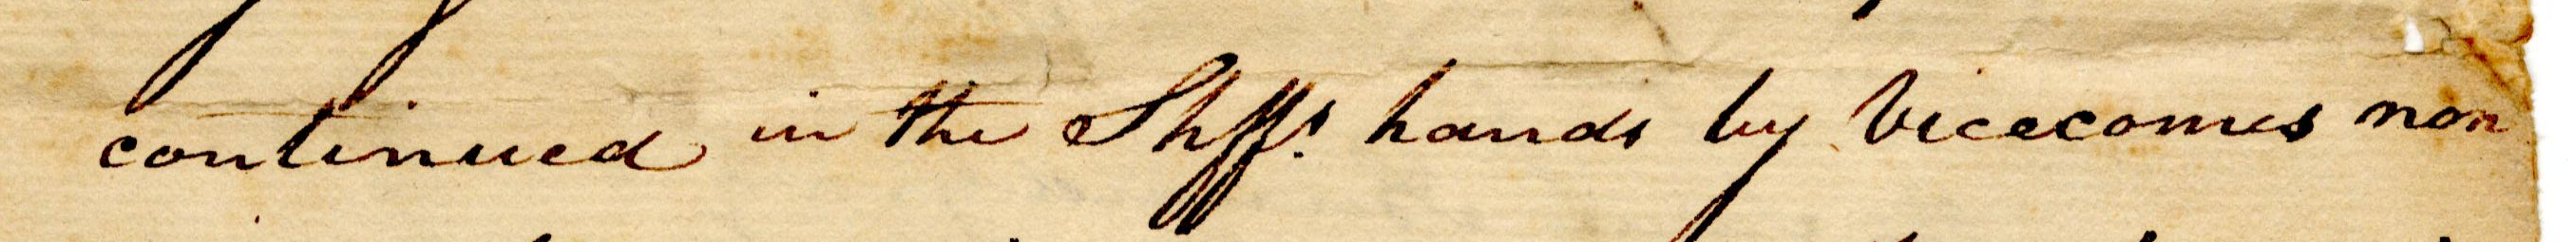continued in the Shff^r. hands by vicecomes non-
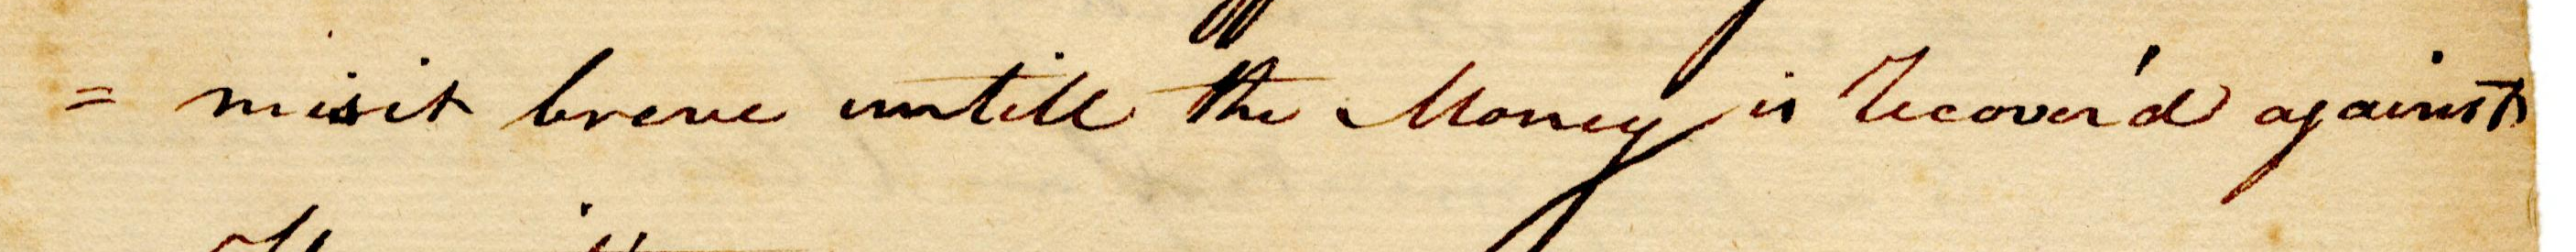-misit breve untill the Money is recover'd against
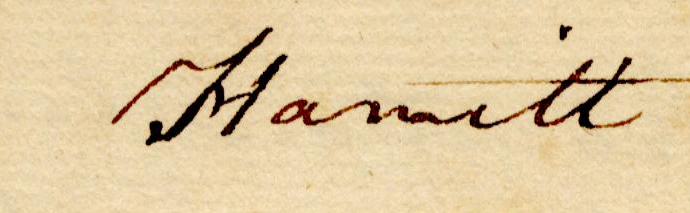Hamitt
